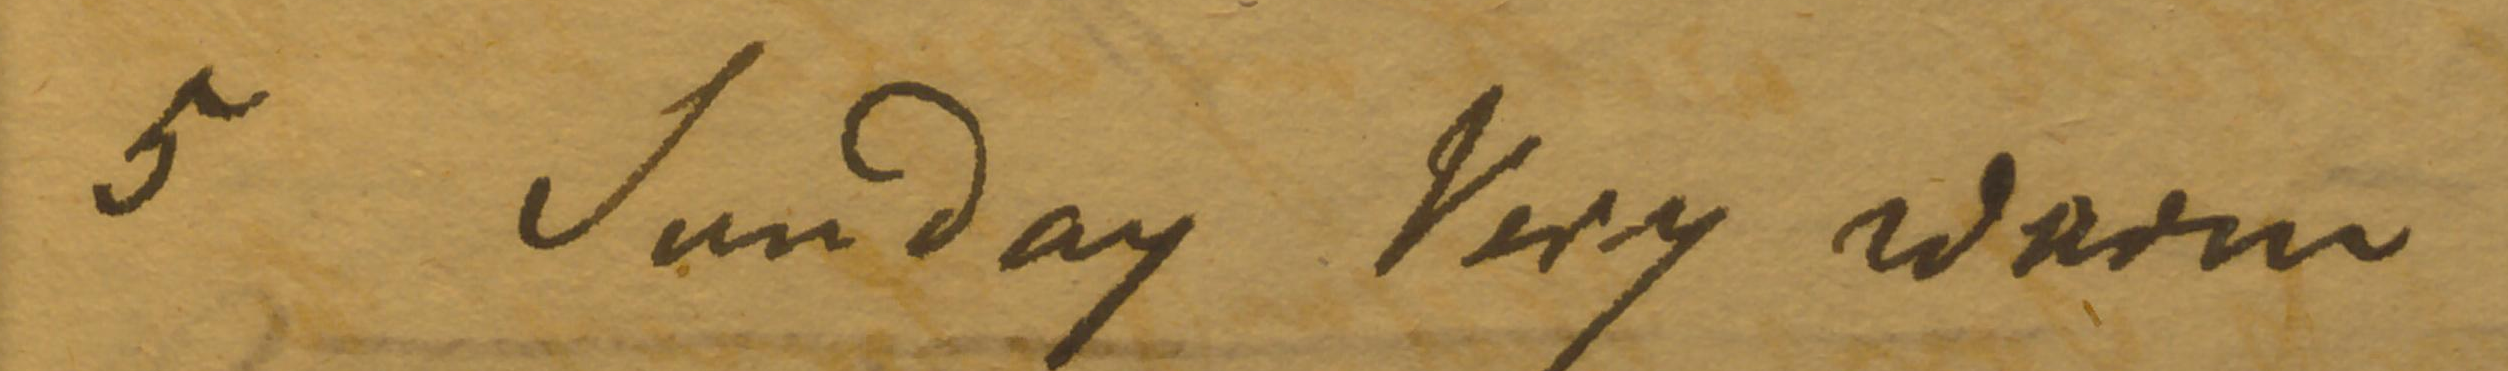5 Sunday Very warm
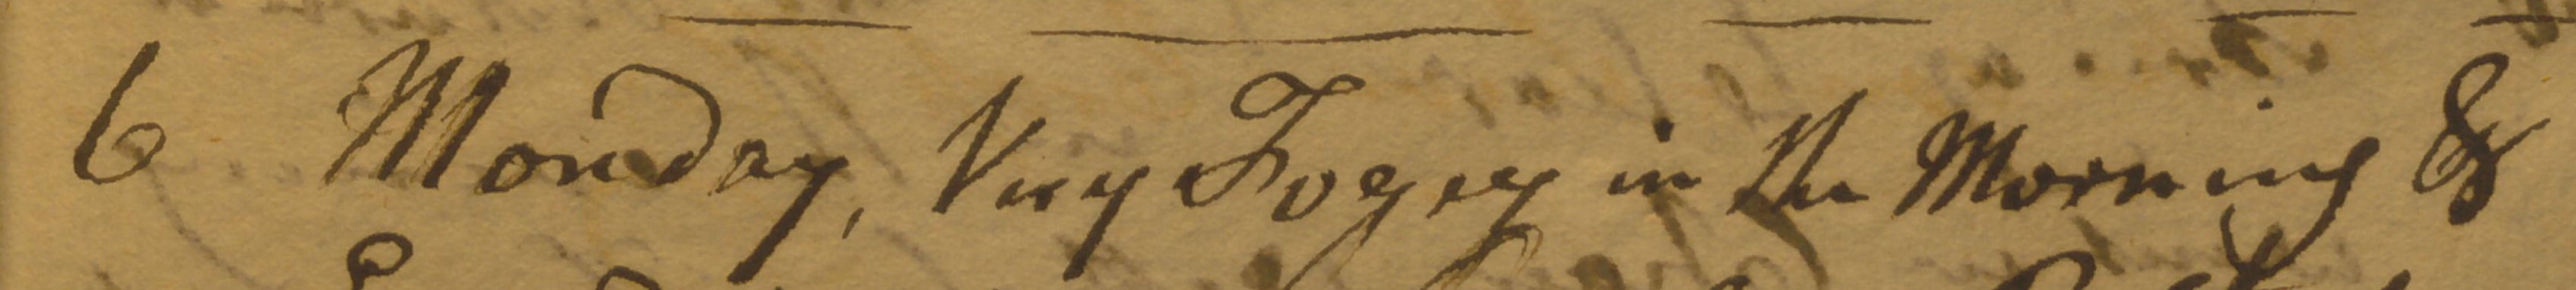6 Monday Very Fogey in the Morning &
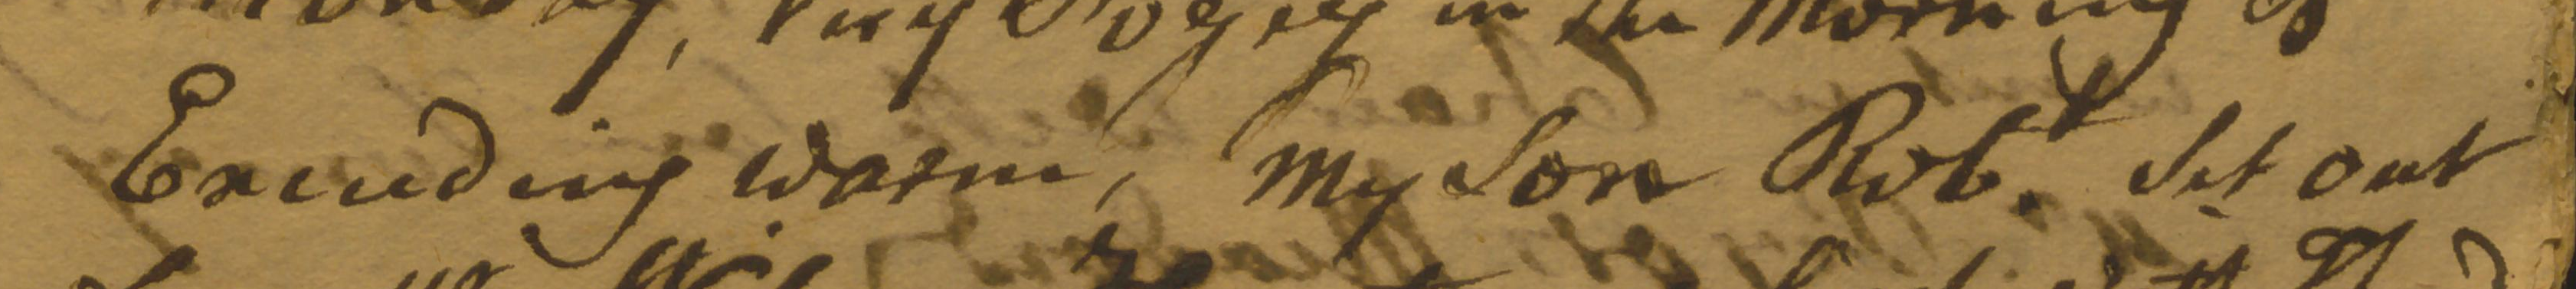Exceeding warm, my son Rob^t. set out
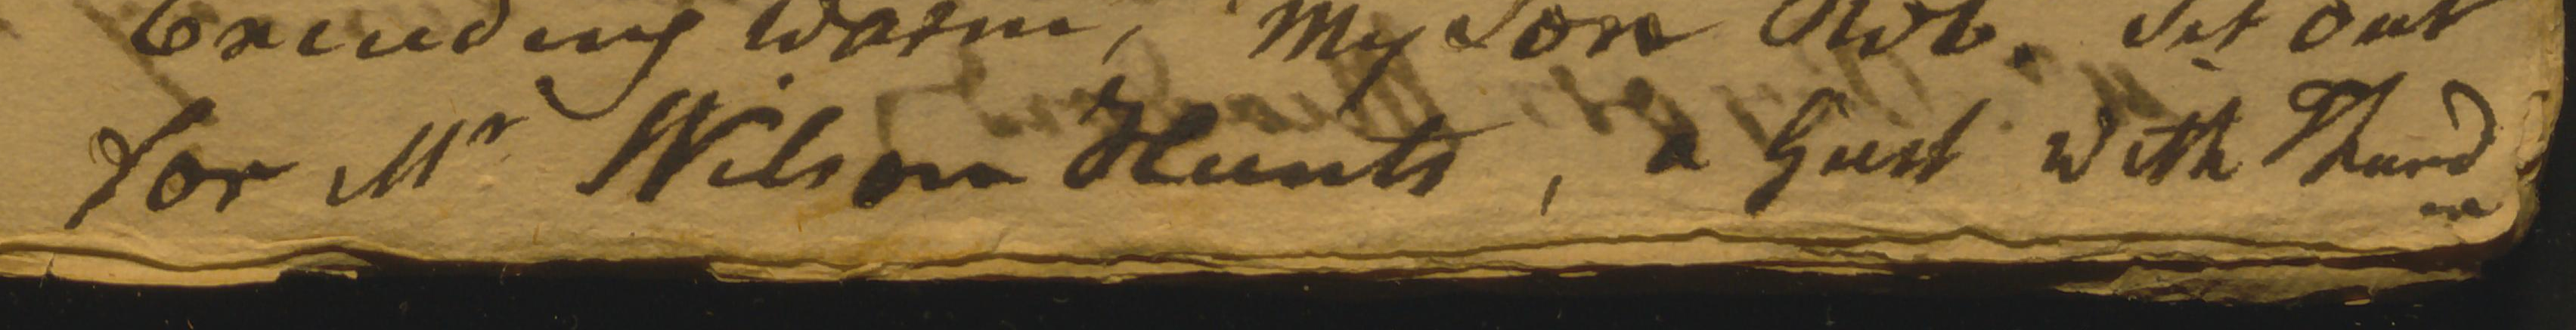for M^r. Wilson Hunts, a Gust with Thund
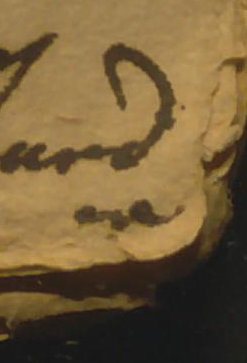er
